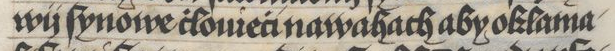wij ſynowe ċlouieċí nawahach aby oklama¬
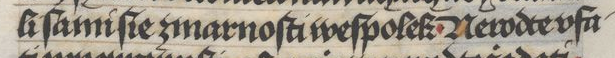li ſami ſie zmarnoſti weſpolek.Nerodte vſa¬
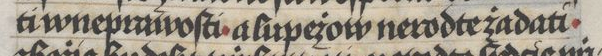ti wneprawoſti.a lupeżow nerodte żadati.
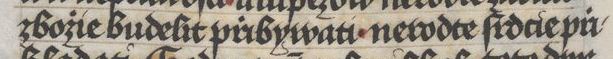zbożíe budelit pṙibywati.nerodte ſrdcie pṙi¬
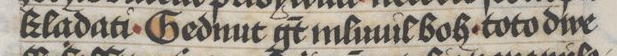kladati.Sednut ḡt mluuil boh.toto dwe
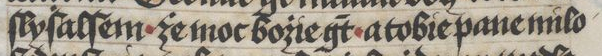ſlyẛalſem.że moc bożie ḡt.a tobie pane milo¬
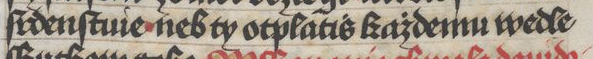ſrdenſtuie.neb ty otplatiṡ każdemu wedlle
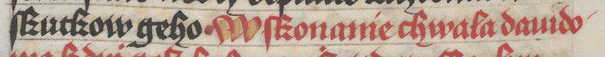ſkutkow geho.Wſkonaníe chwala dauido¬
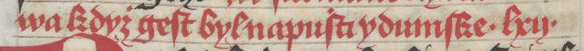wa kdyż geſt byl napuẛti ydumſke.lxij.
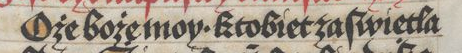Ože boże moy.ktobiet zaſwietla
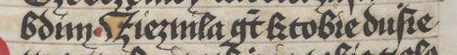bdím.Żieznila ḡt ktobie duẛie
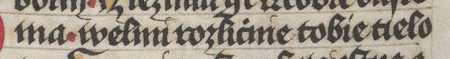ma.welmi rozliċnie tobie tielo
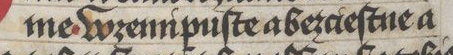me.Wzemi puſte a bezcieſtne a
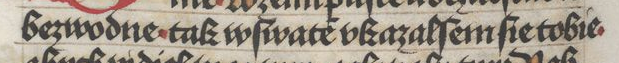bezwodne.tak wſwatē vkazalſem ſie tobie.
